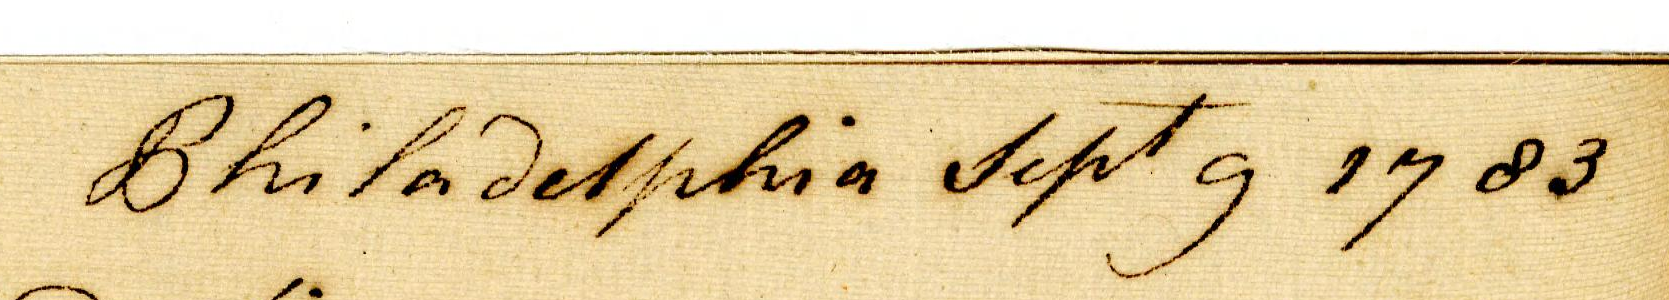Philadelphia Sep^t 9 1783
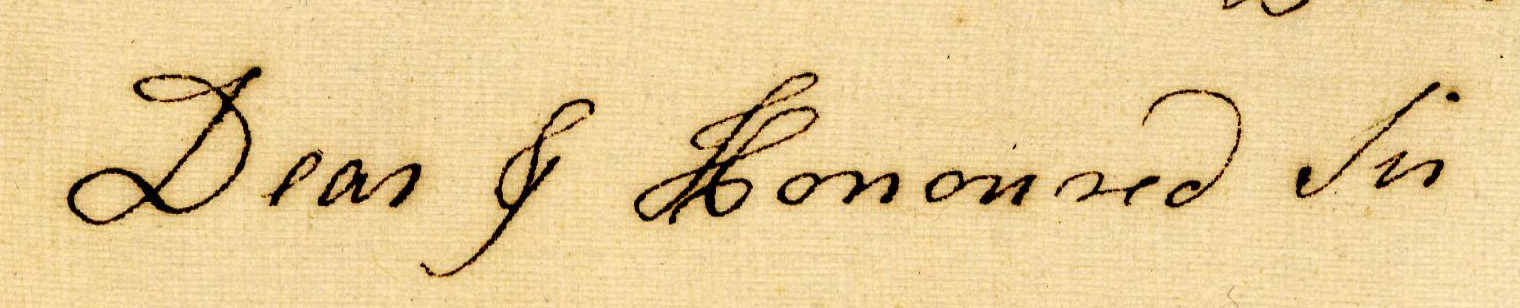Dear & Honoured sir
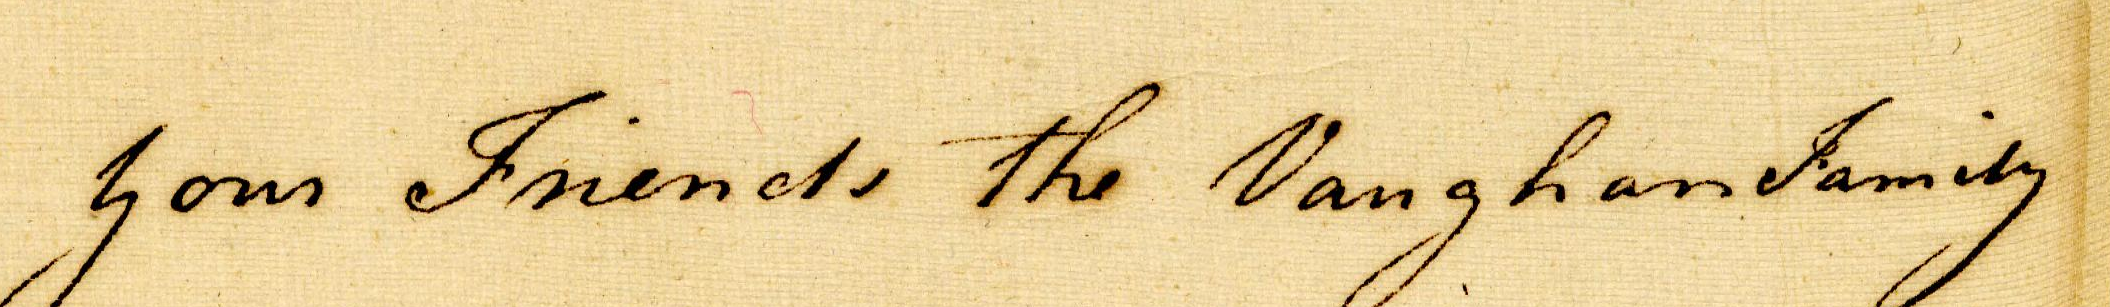Your Friends the Vaughan Family
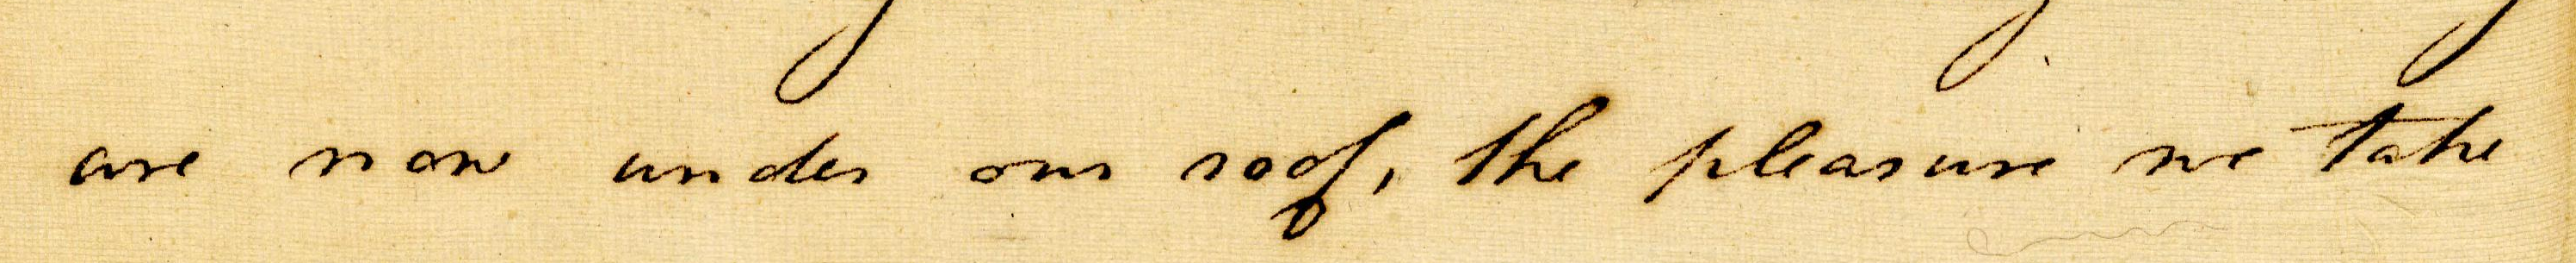are now under our roof, the pleasure we take
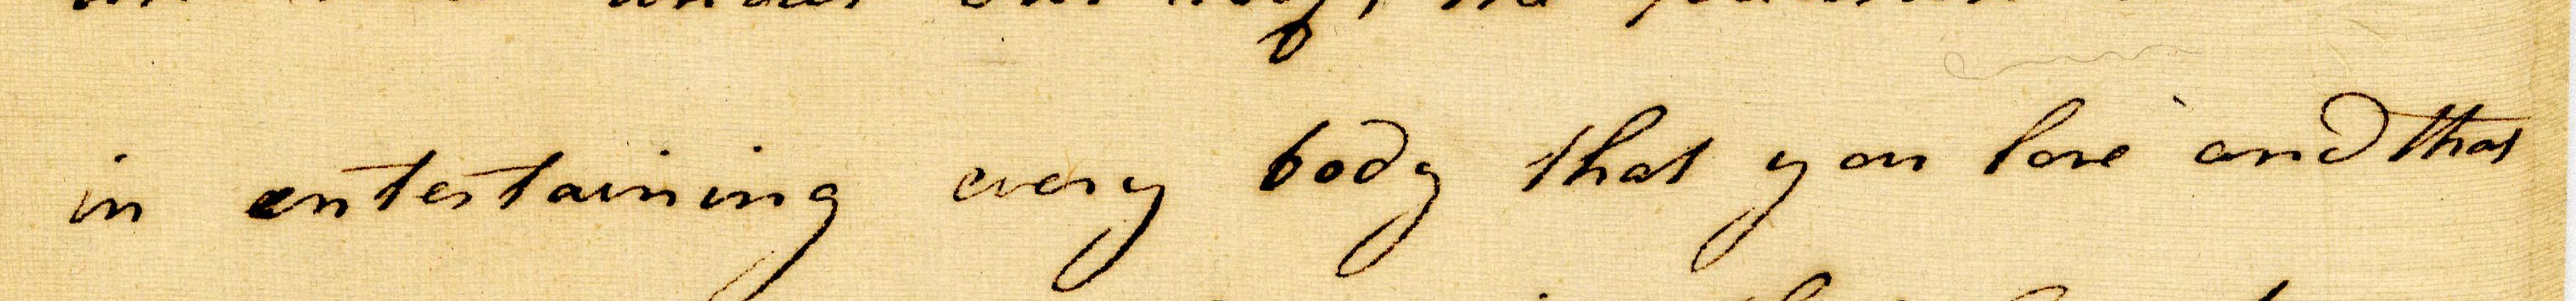in entertaining every body that you love and that
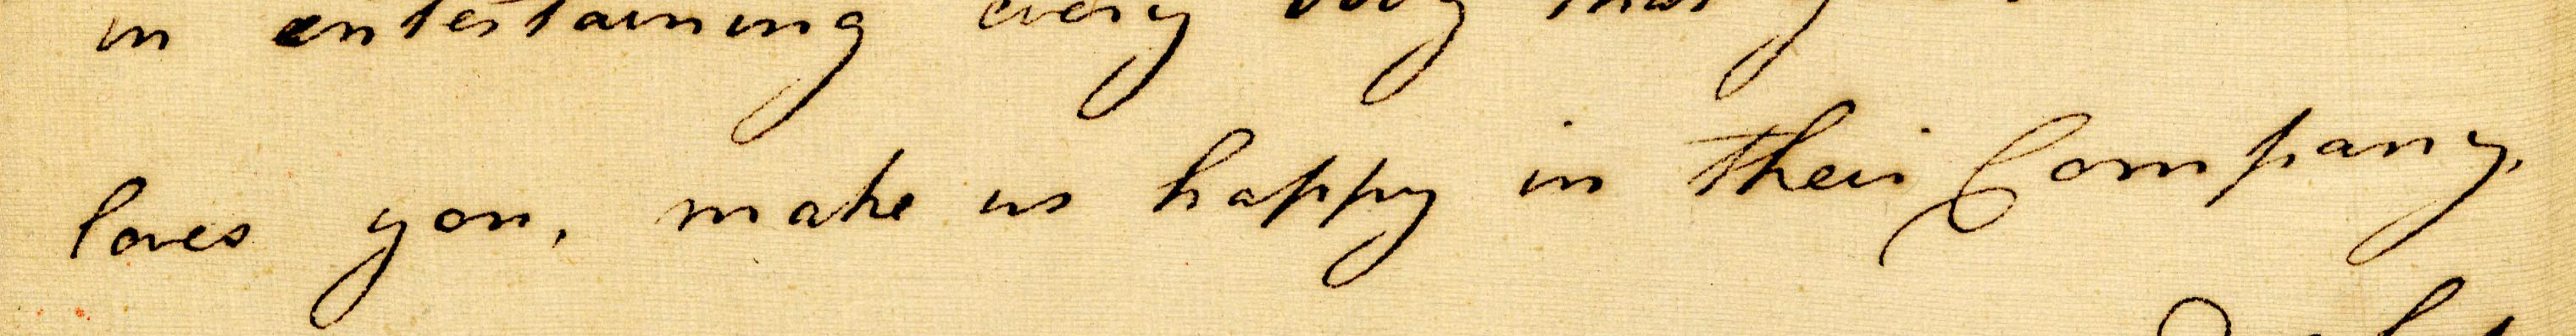loves you, make us happy in their Company,
